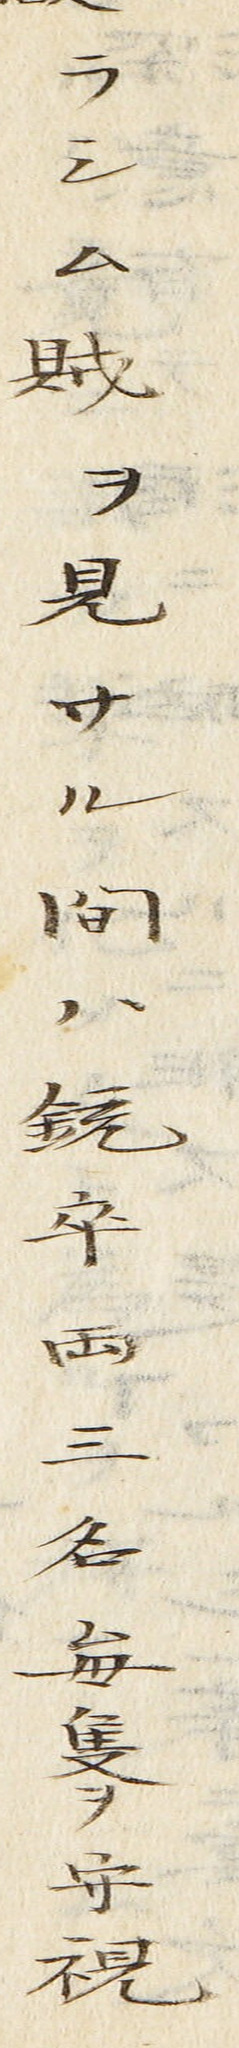ラシム賊ヲ見サル間ハ銃卒両三名毎隻ヲ守視
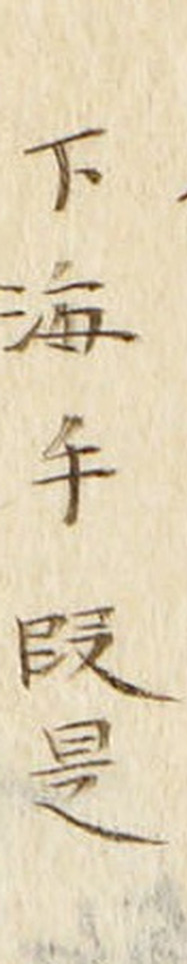下海手叚是
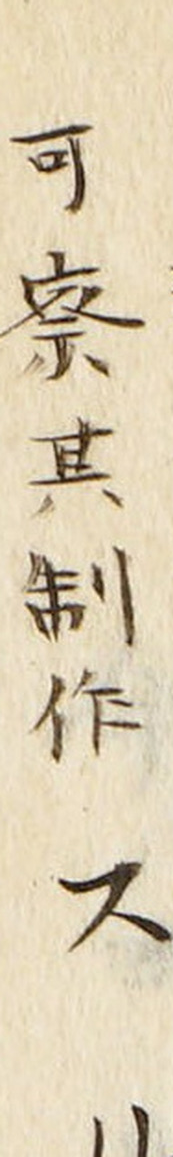可察其制作
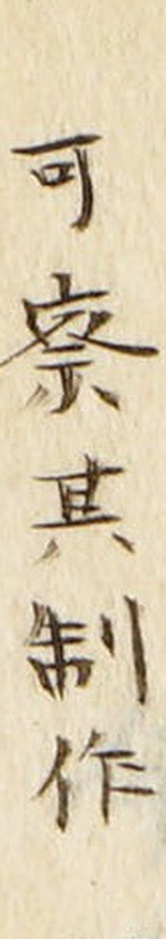可察其制作
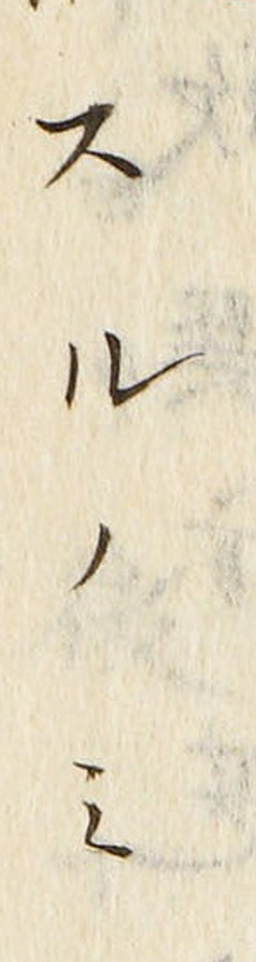スルノミ
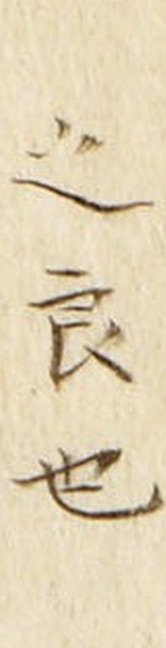之良也
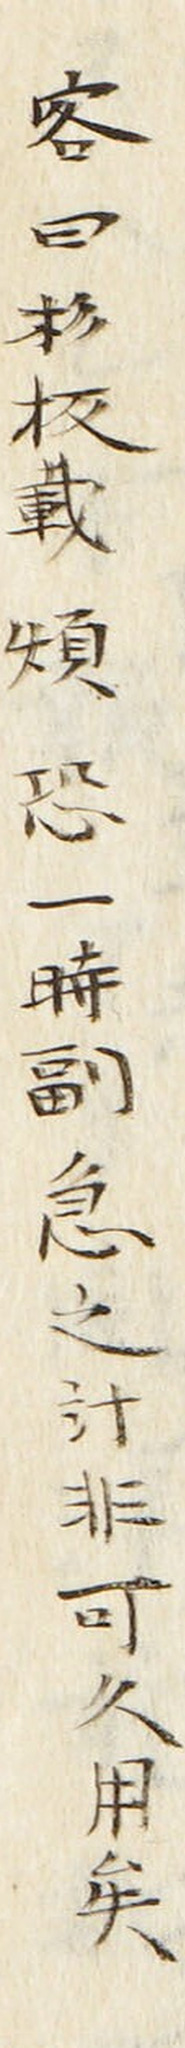客曰杉板載煩恐一時副急之計非可久用矣
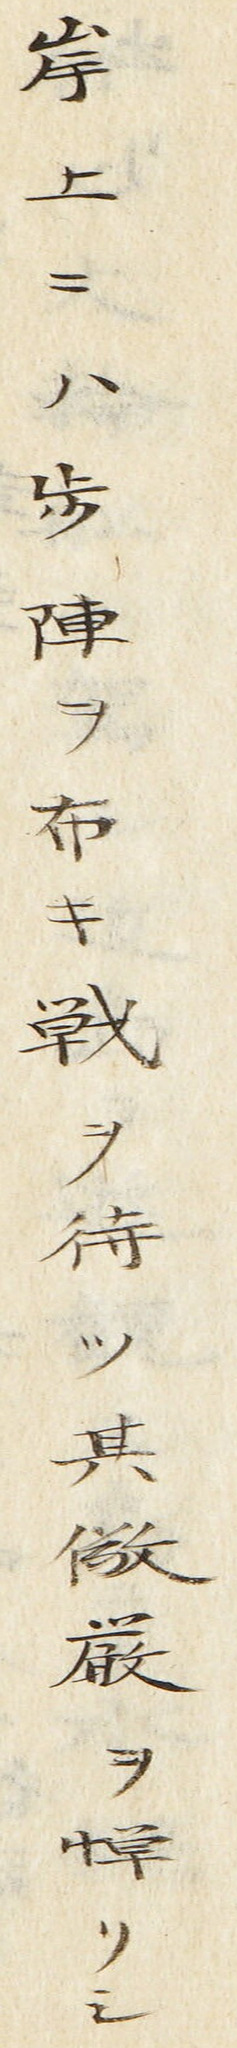岸上ニハ歩陣ヲ布キ戦ヲ待ツ其儆厳ヲ憚リシ
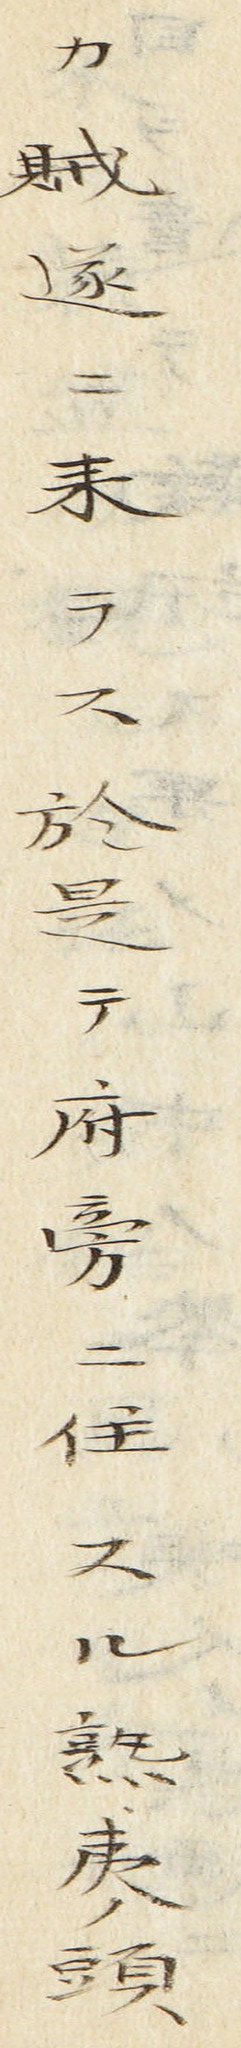カ賊遂ニ来ラス於是テ府旁ニ住スル熟夷ノ頭

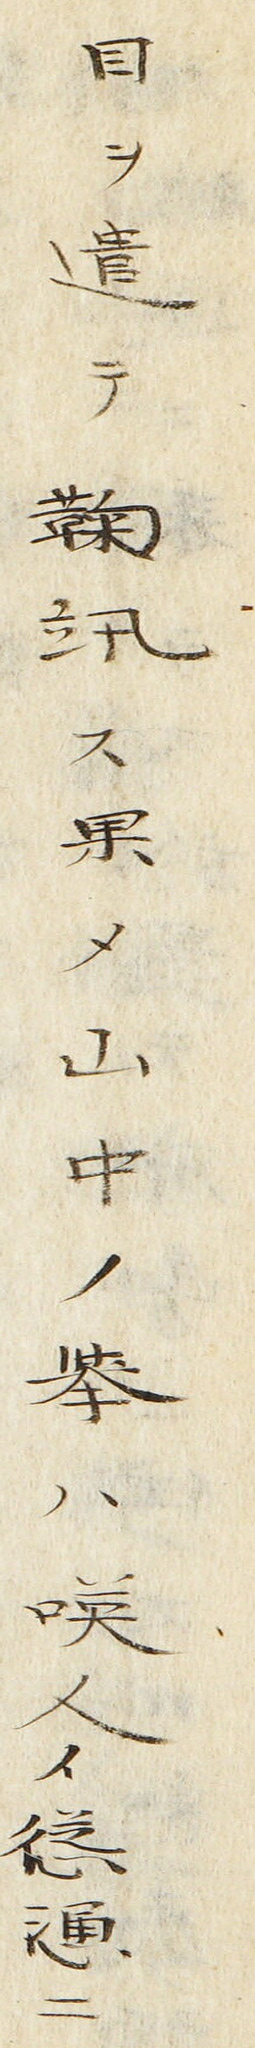目ヲ遣テ鞠訊ス果シテ山中ノ拳ハ𠸄人ノ慫慂ニ
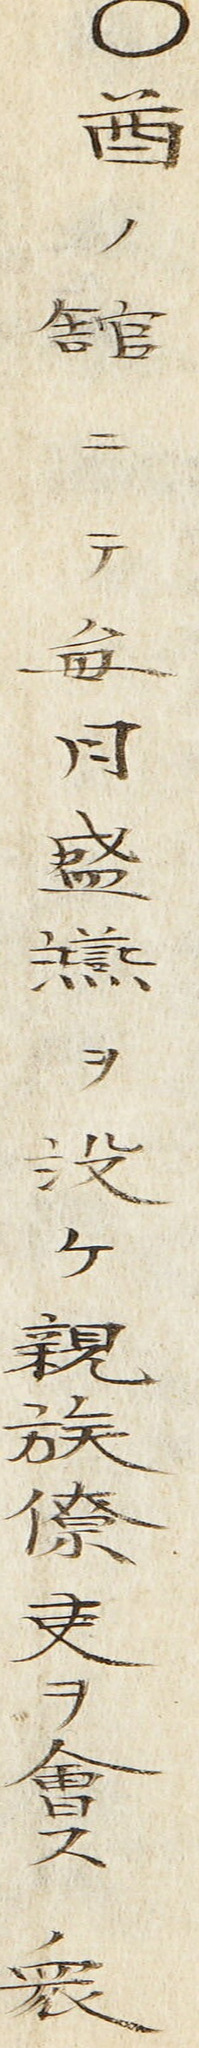○酋ノ館ニテ毎月盛讌ヲ設ケ親族僚吏ヲ会ス衆
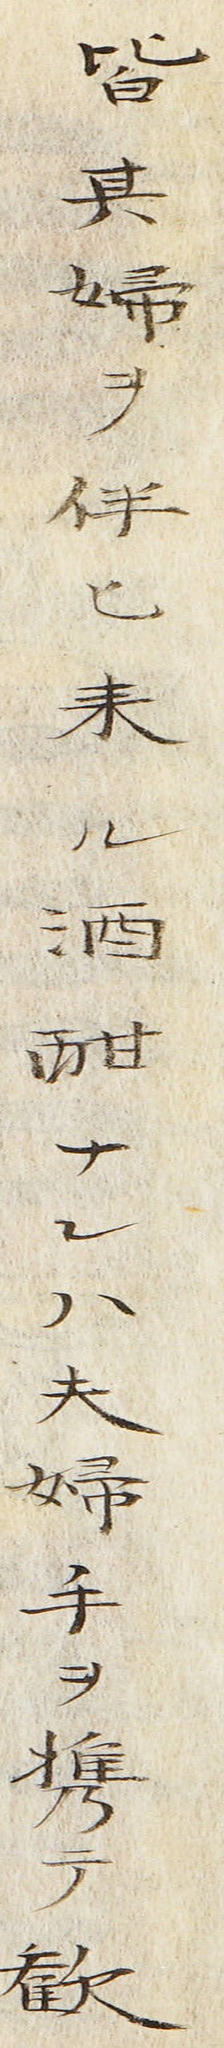皆其婦ヲ伴ヒ来ル酒酣ナレハ夫婦手ヲ携テ歓
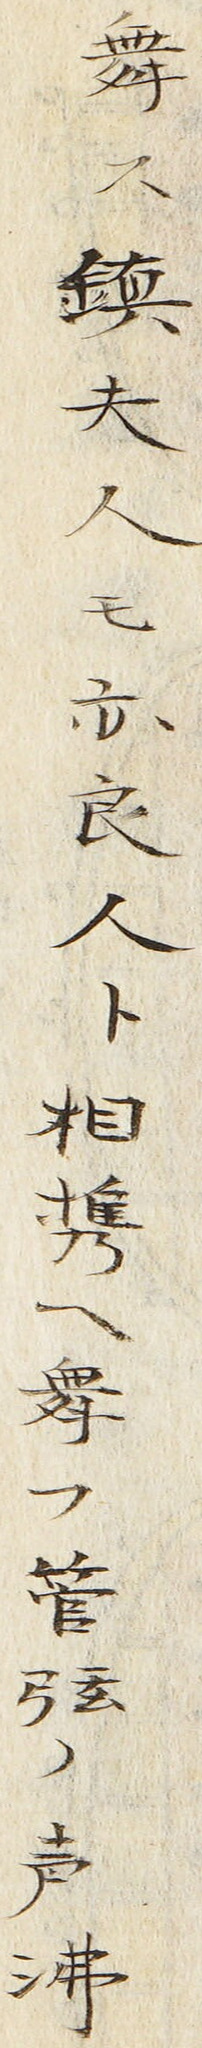舞ス鎮夫人モ亦良人ト相携ヘ舞フ管弦ノ声沸
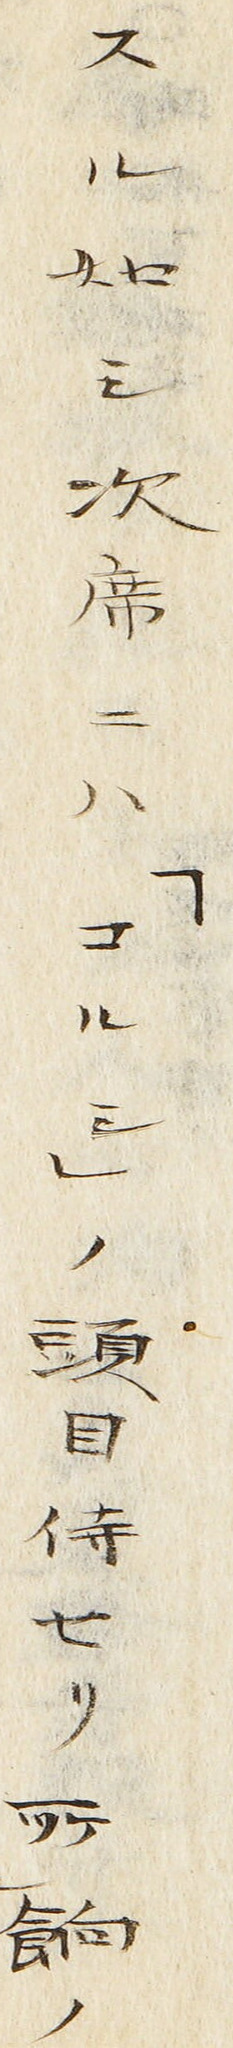スル如シ次席ニハ「コルシ」ノ頭目侍セリ所餉ノ
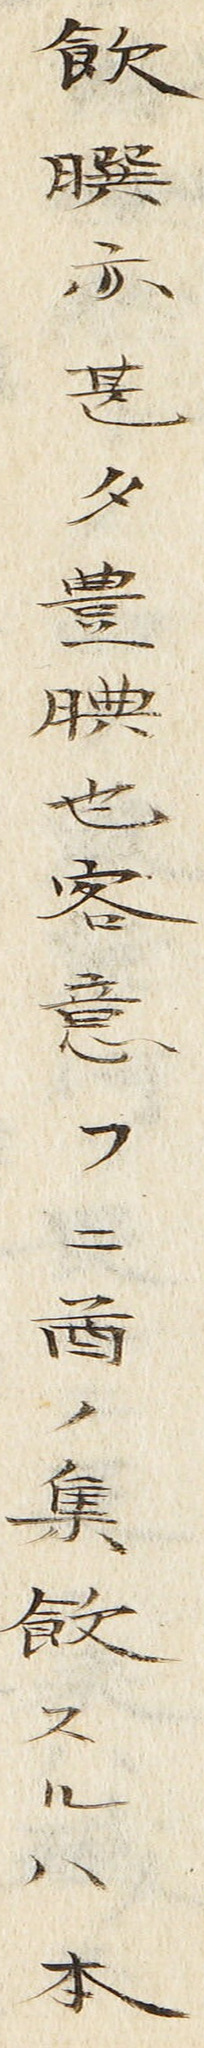飲𦠆亦甚タ豊腆也客意フニ酋ノ集飲スルハ本
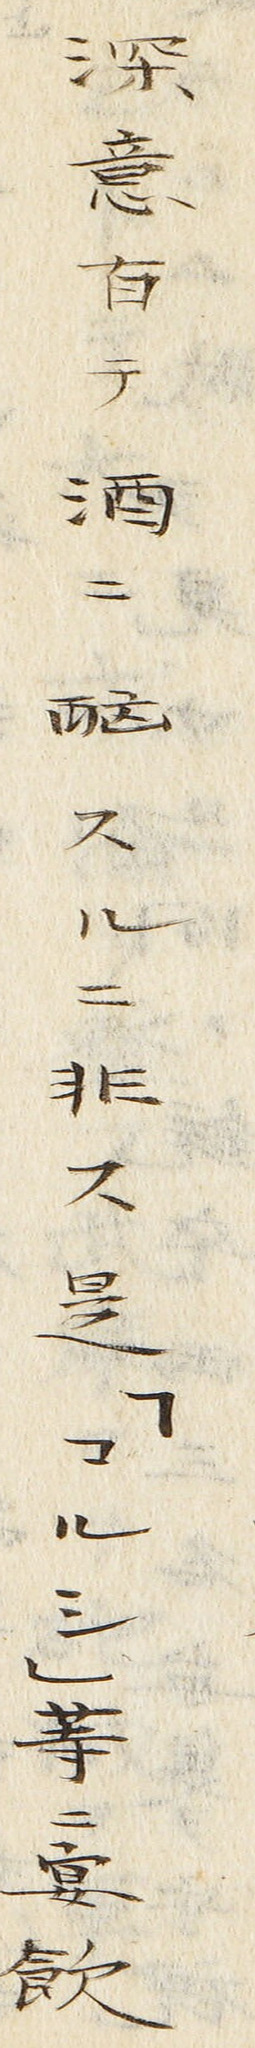深意有テ酒ニ酗スルニ非ス是「コルシ」等ニ宴飲
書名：流蕃通書
